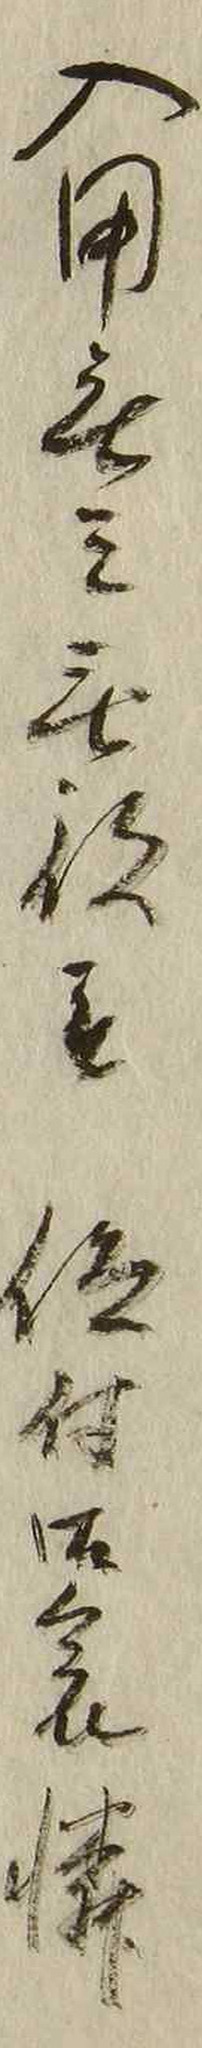入用無之無役被仰付御哀憐
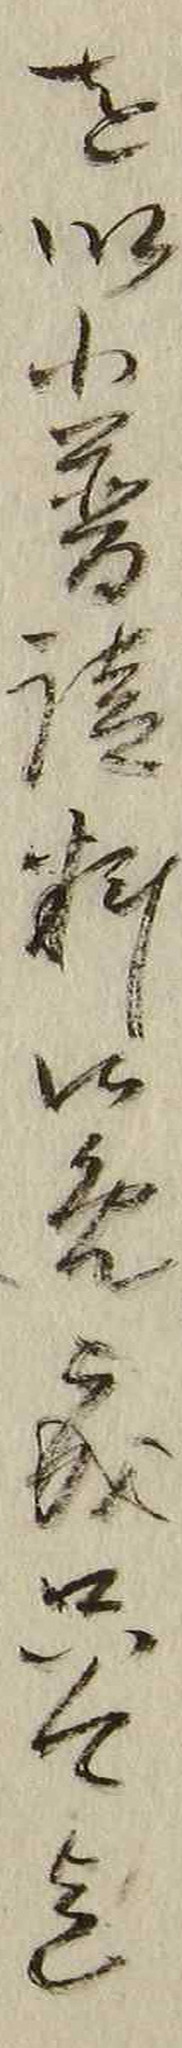を以小普請料御免被成只今迄
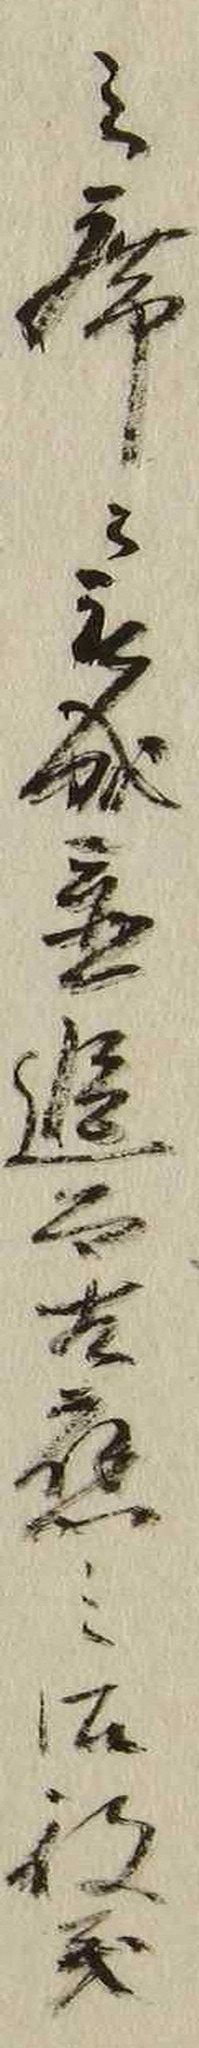之席ニ被成置追而相応之御役義
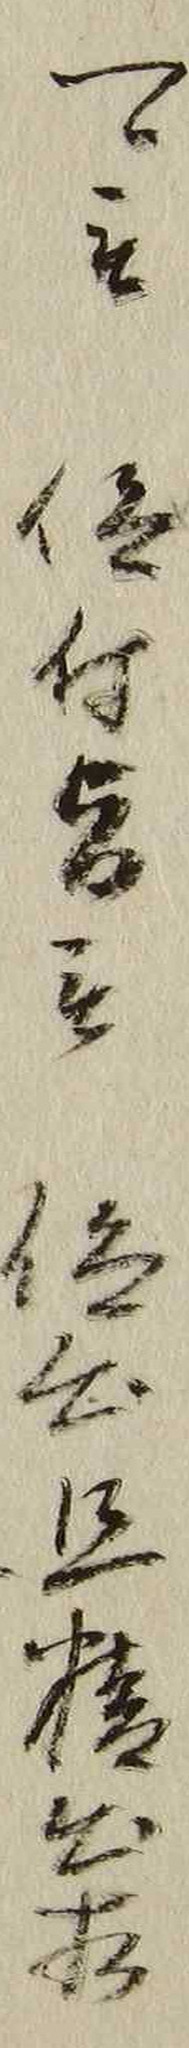可被仰付旨被仰出且精出相
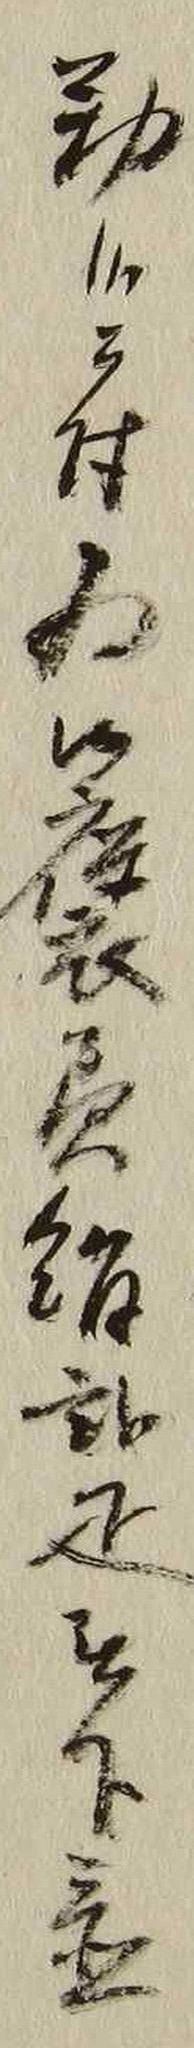勤候ニ付為御褒美絹弐疋被下置
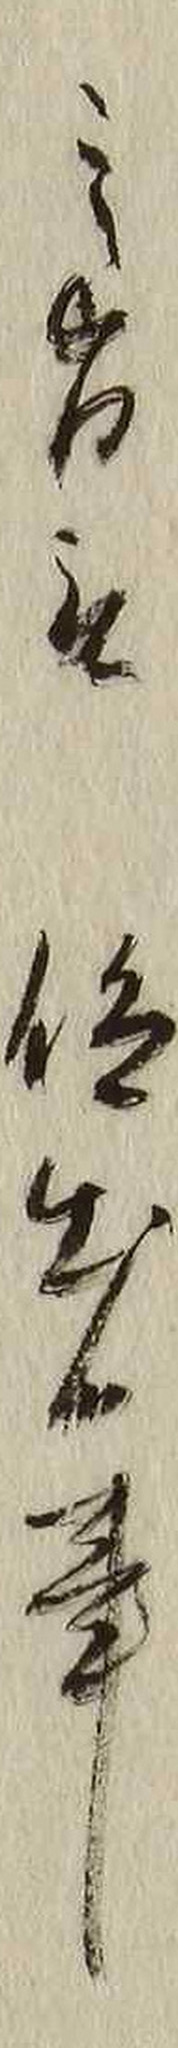之旨被仰出候事
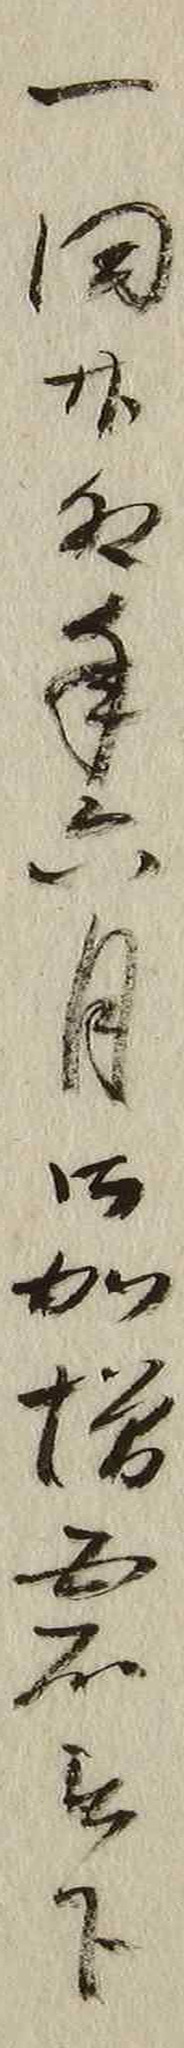一同廿卯年六月御加増五石被下
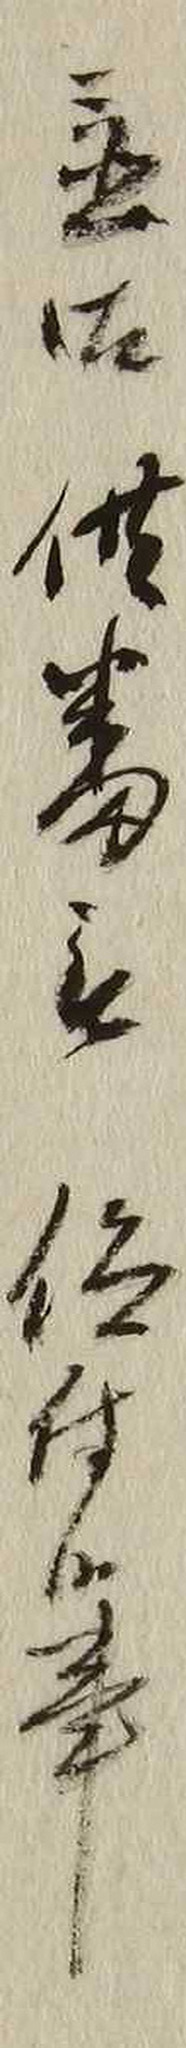置御供番被仰付候事
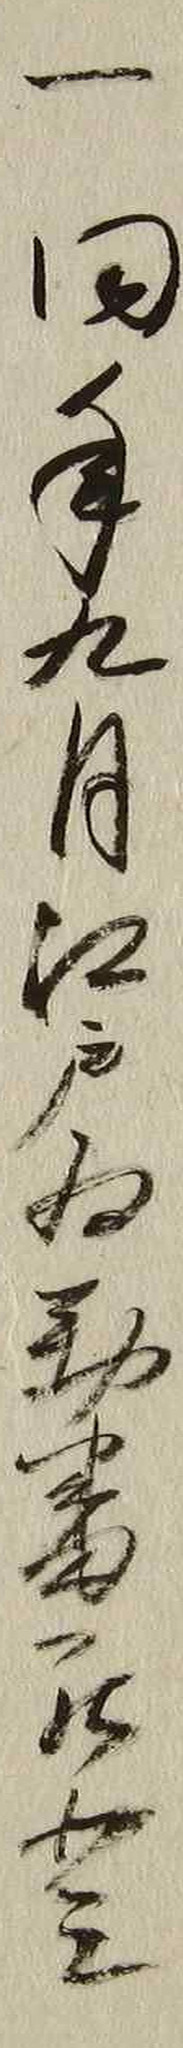一同年九月江戸為勤番罷登
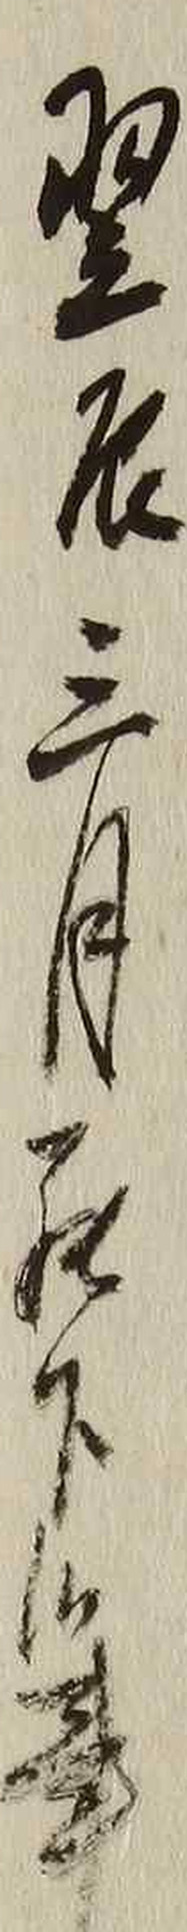翌辰三月罷下候事
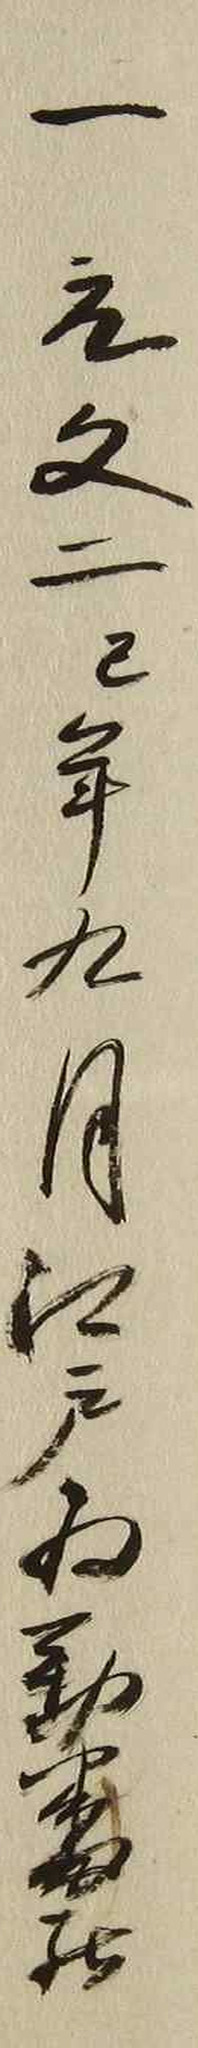一元文二巳年九月江戸為勤番罷
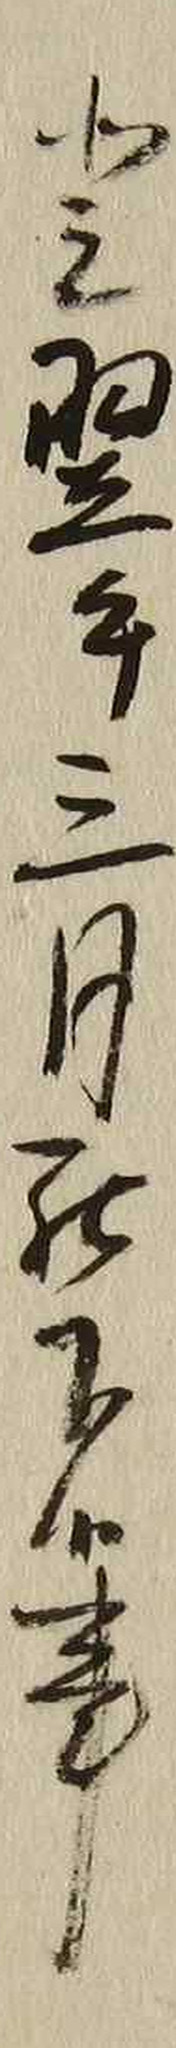登翌午三月罷下候事
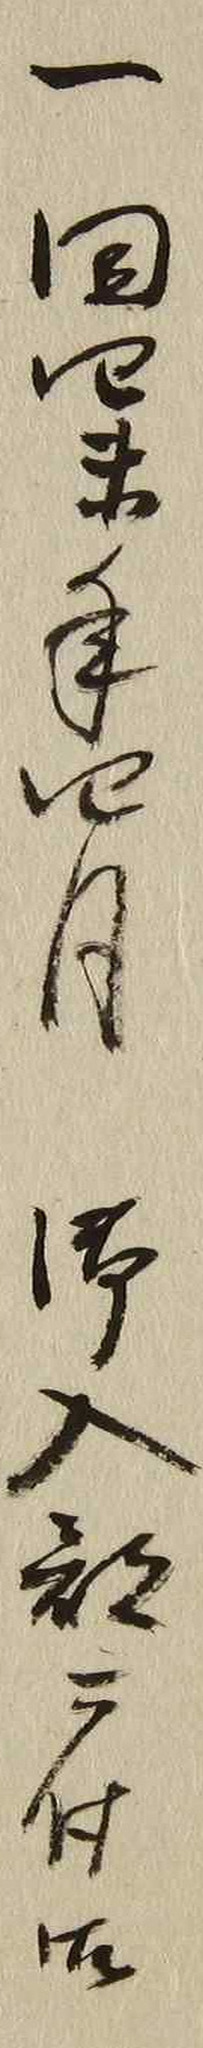一同四未年四月御入部ニ付御
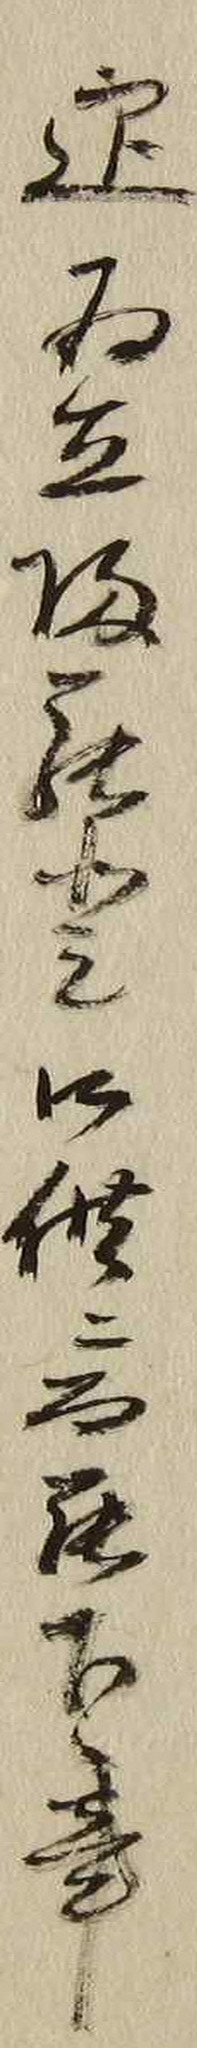迎為立帰罷登御供ニ而罷下候事
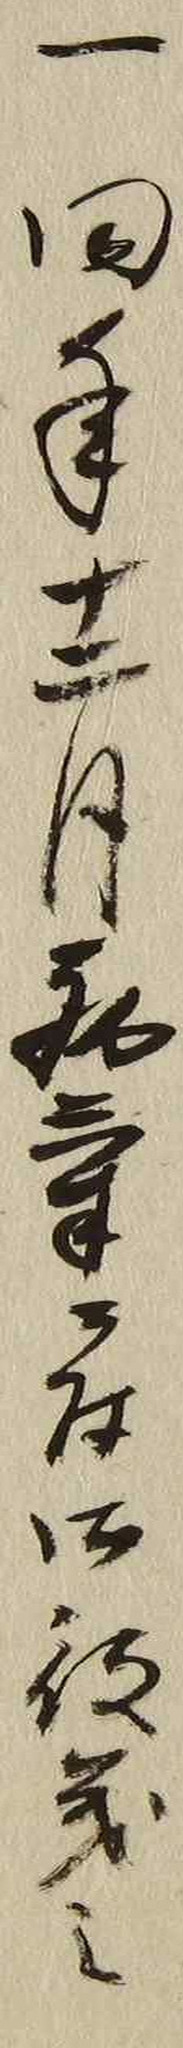一同年十二月病気ニ付御役義之
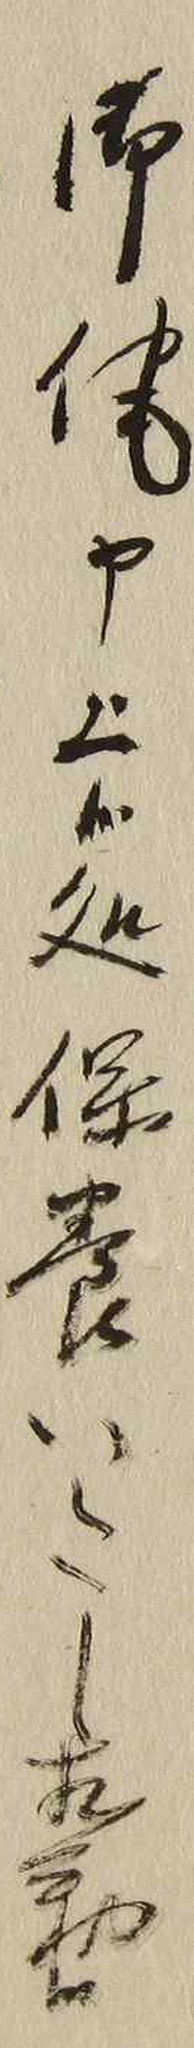御侘申上候処保養いたし相勤候
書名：諸士系譜　巻之346　も之部2
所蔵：会津若松市立会津図書館
